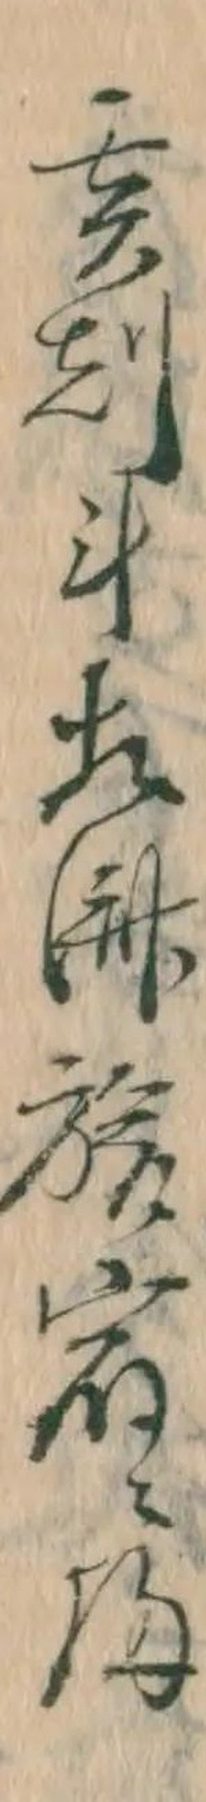亥刻斗相済旅宿ニ帰
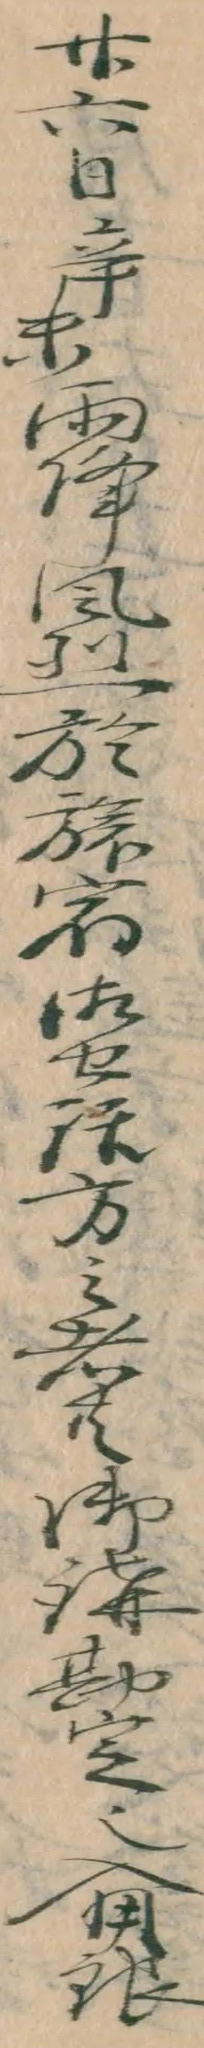廿六日辛未雨降風烈於旅宿御世話方之者共御講勘定也入用銀
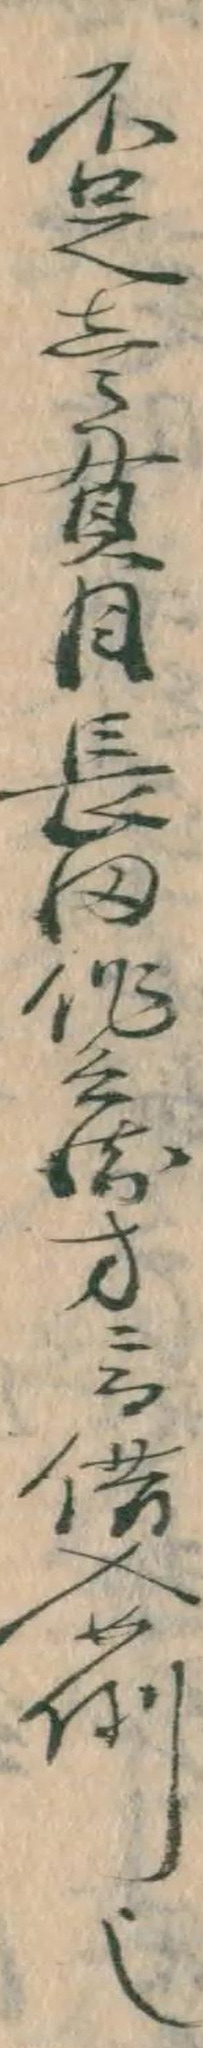不足壱貫目長田作兵衛方ニ而借入如例也
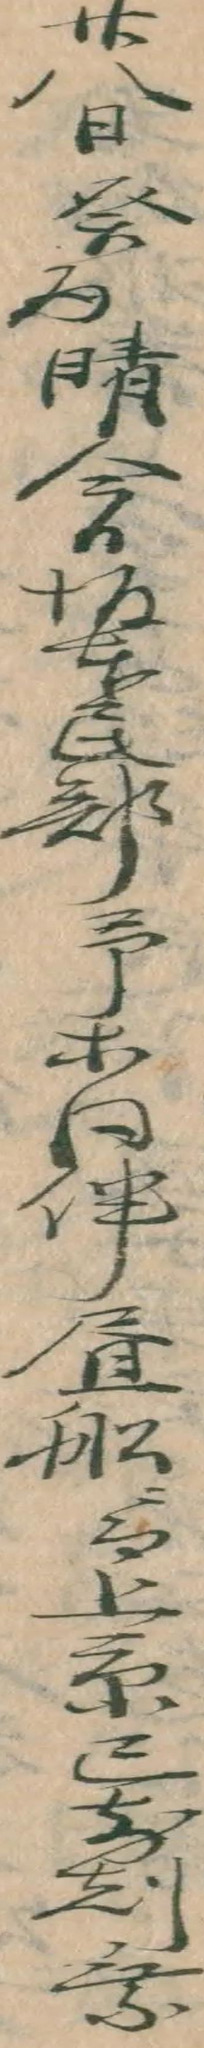廿八日癸卯晴今日坂本民部予等同伴昼舩ニ而上京巳前刻乗
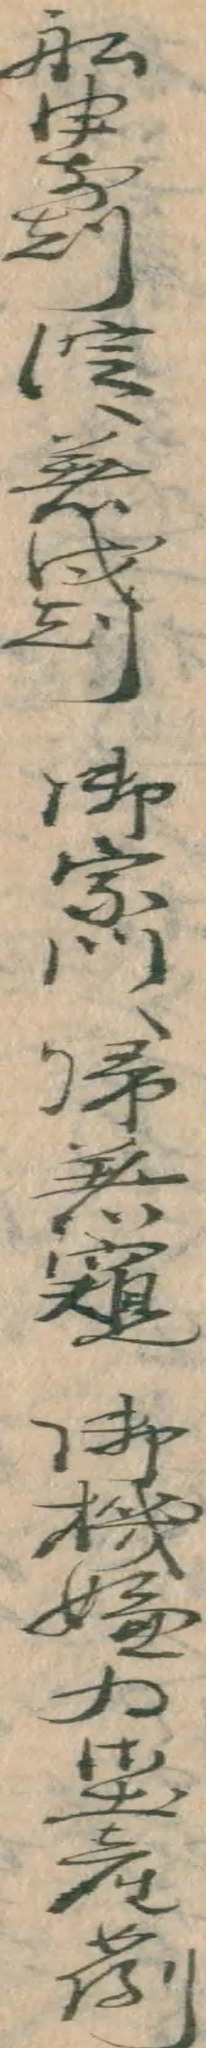舩申前刻院へ着戌刻御家門へ帰着窺御機嫌為御土産如例
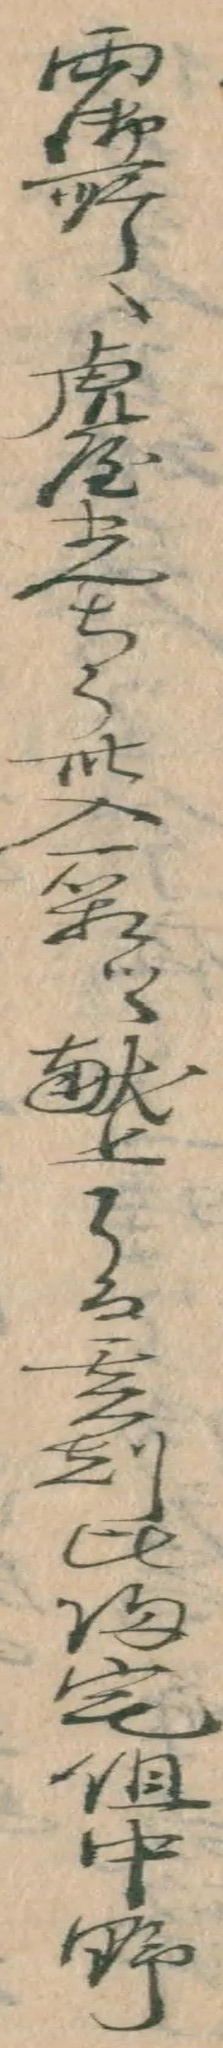両御所へ虎屋まんちう卅入一箱ツヽ献上了而亥刻比帰宅但中野
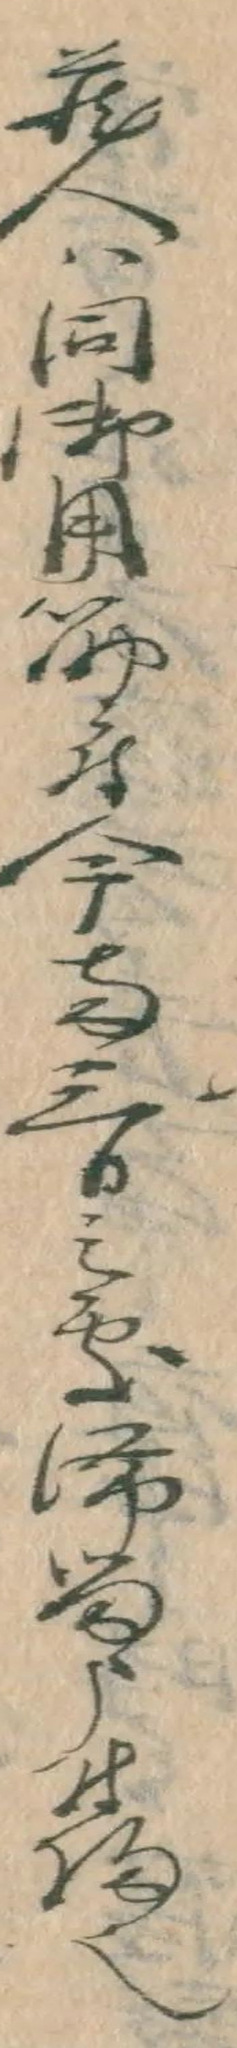蔵人ハ同御用筋ニ付今両三日之處滞留申付帰也
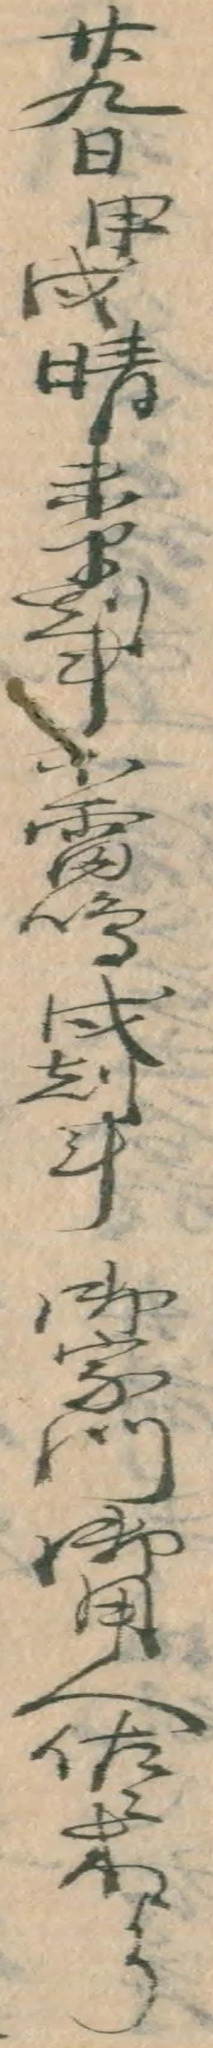廿九日甲戌晴未半刻計小雷鳴戌刻斗御家門御用人佐々木より
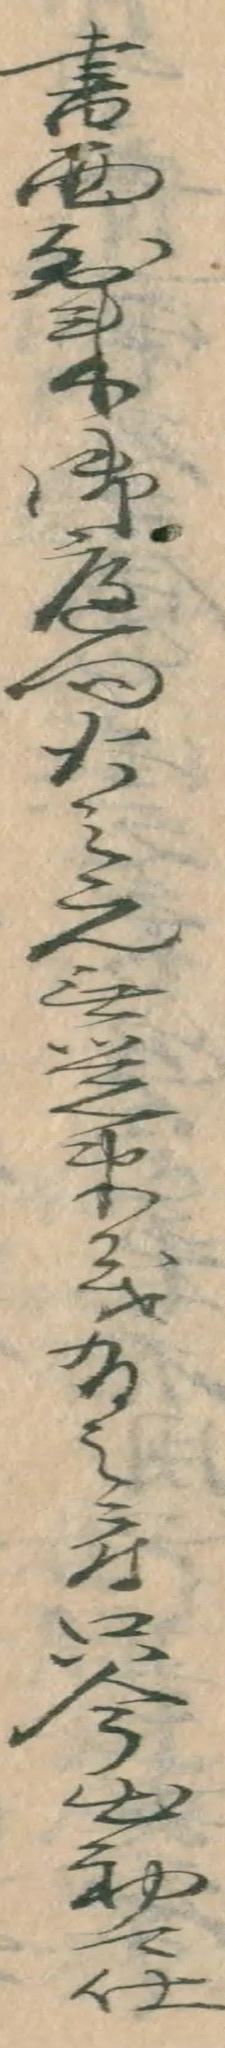書面到来御庭向火之元無覚束義有之ニ付只今出勤可仕
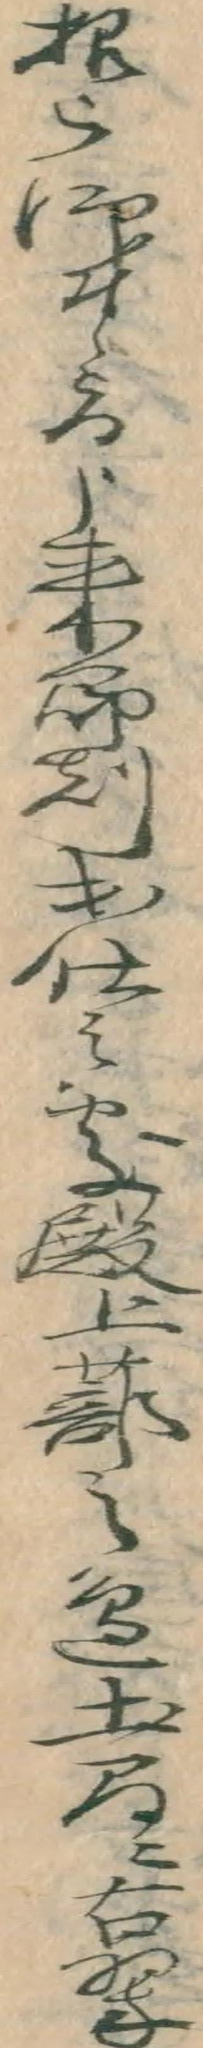様被仰付候旨申来即刻出仕之處殿上蔀之辺土間二右翌

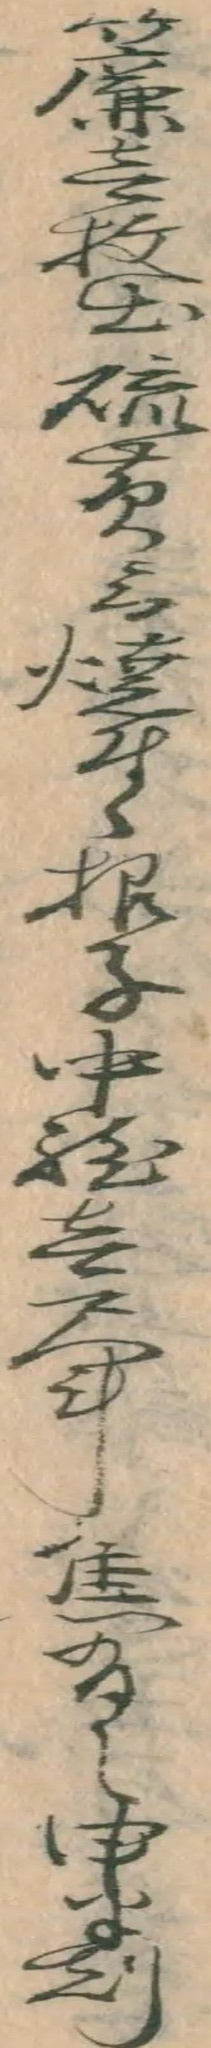簾壱枚出硫黄ニ而焼付候様子中程壱尺斗焦有之申半刻
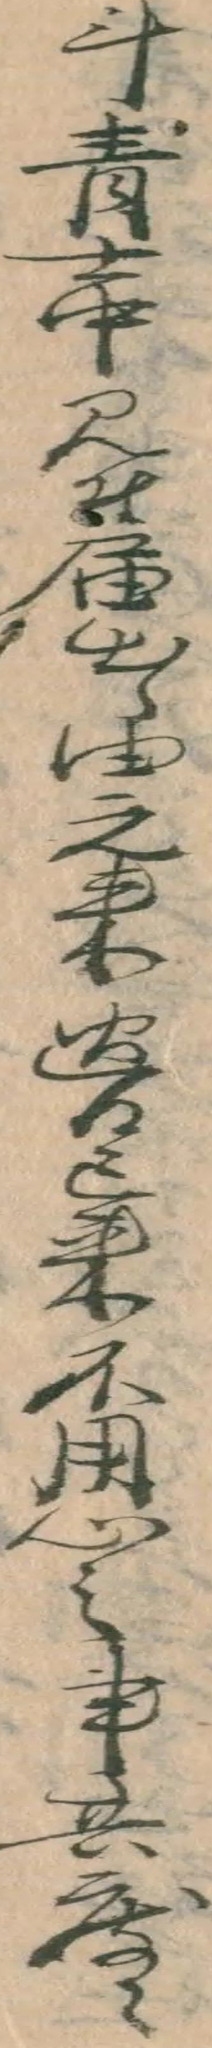斗青士中見罷届出候由元来過日已来不用心之事共度々
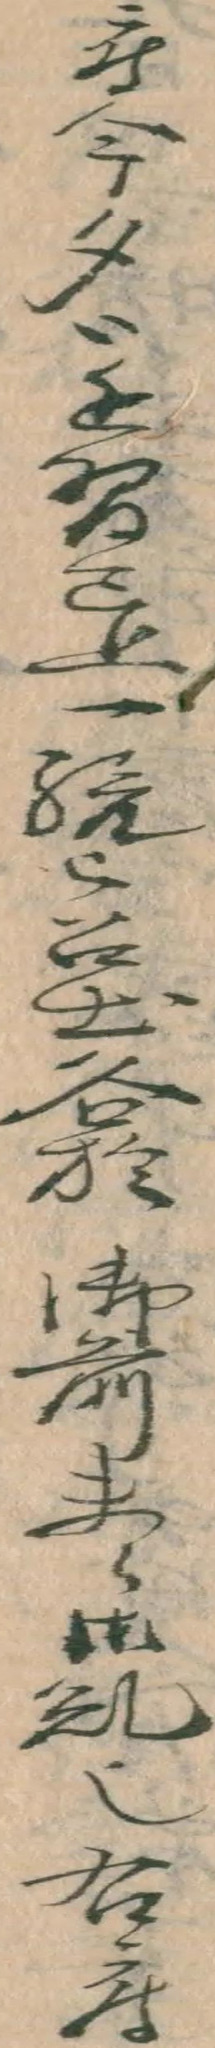ニ付今夕ハ近習已上一統被召出各於御前未々御糺也右ニ付
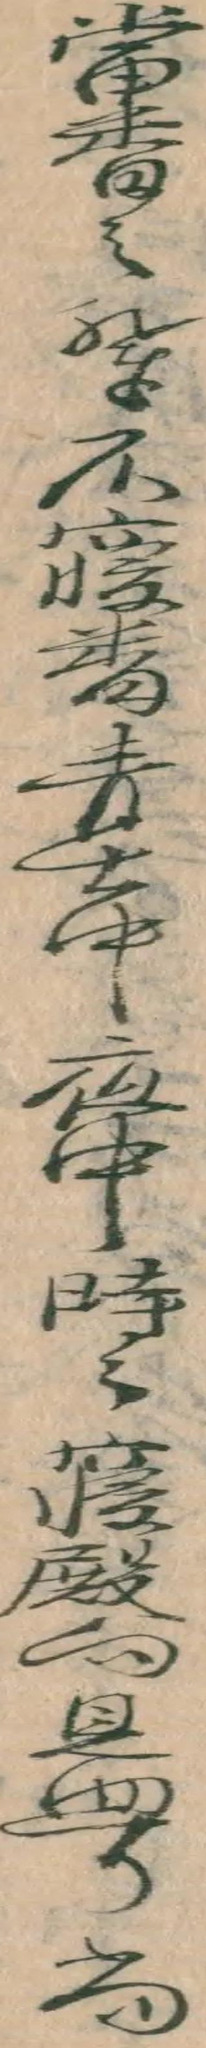當番之輩不寝番青士中夜中時々寝殿向見廻リ當
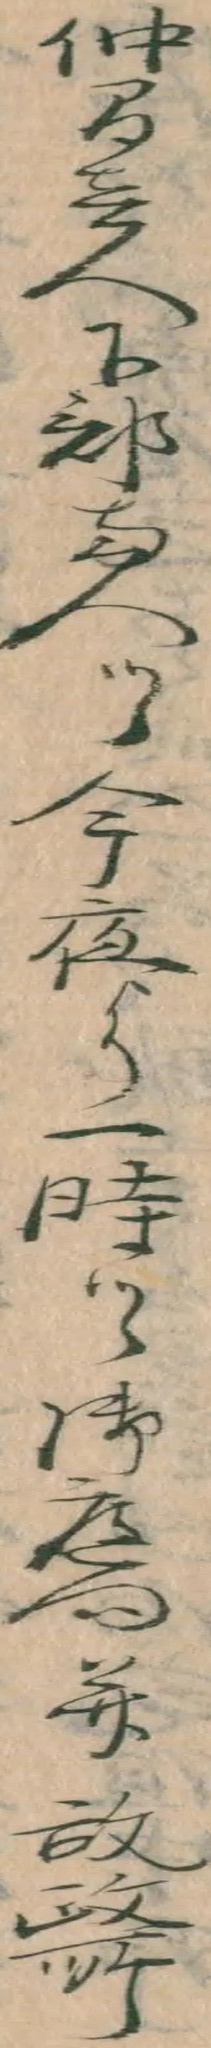仲間壱人下部両人ツヽ今夜より一時ツヽ御庭向幷故政所
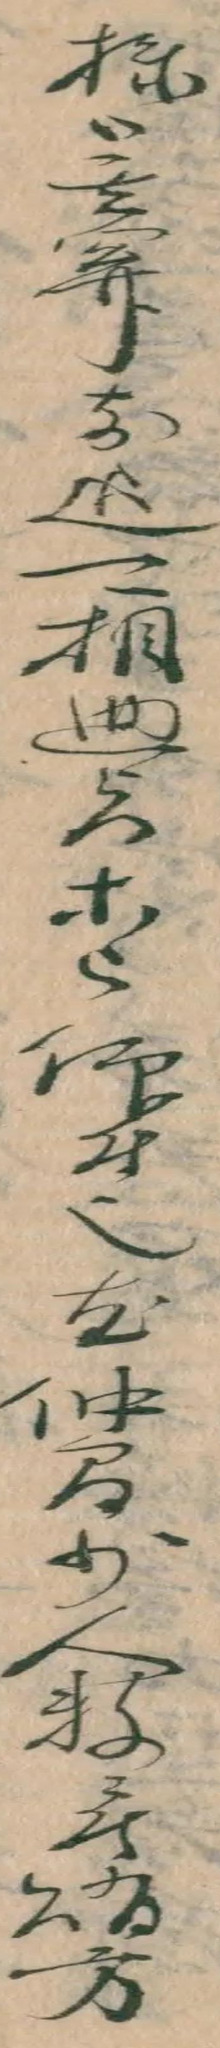様御玄関前迄可相廻旨等被仰付也尤仲間少人数ニ付賄方
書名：賀茂社記録. 第65冊
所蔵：国立国会図書館 National Diet Library, JAPAN
